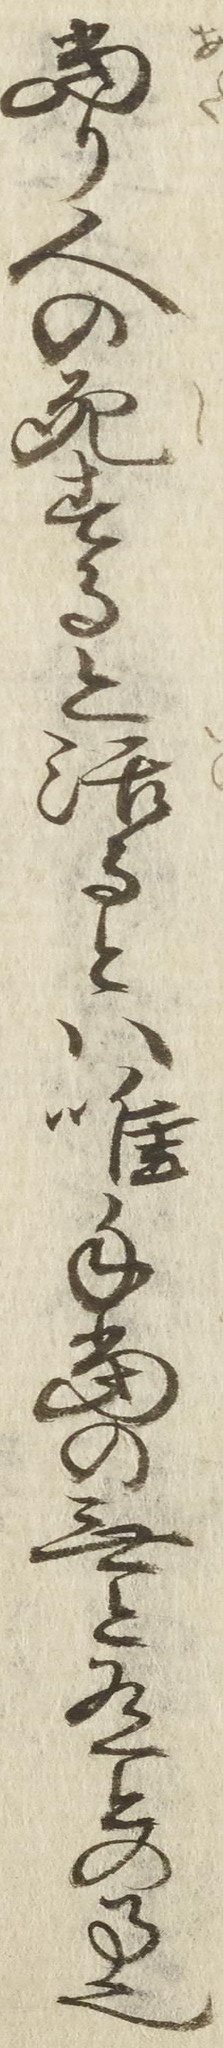当り人の死すると活るとは唯手当の無と有との事也
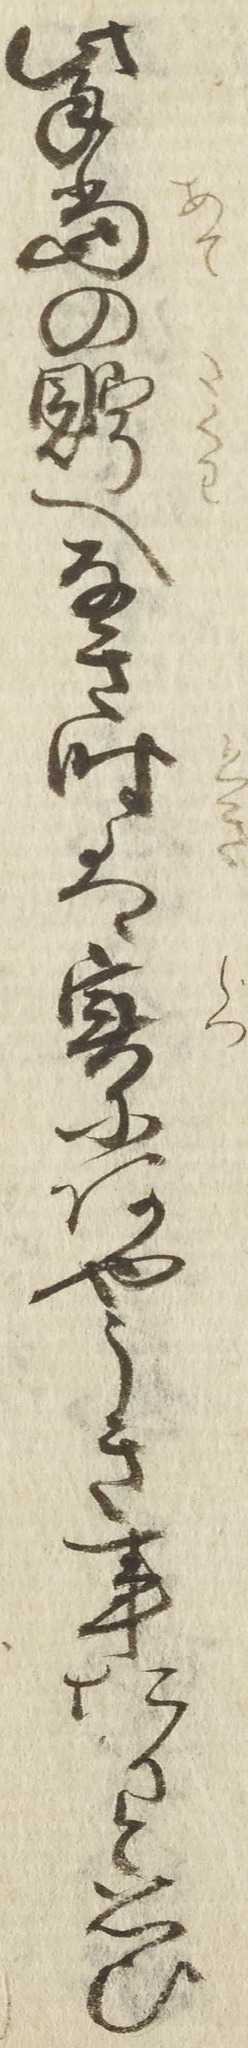此手当の貯へなき時は実にあやうき事たりと思ひ
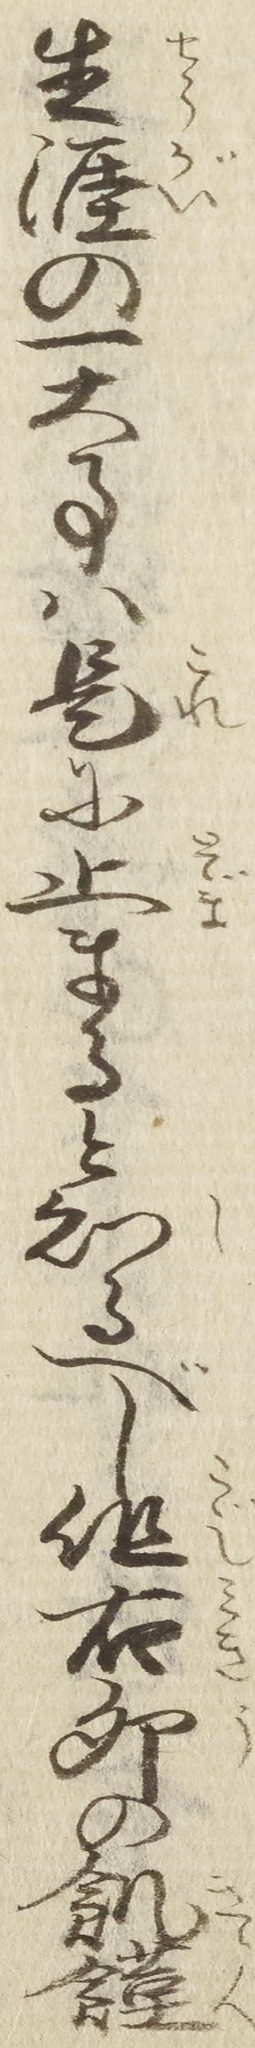生涯の一大事は是に止まると知るべし但右卯の飢饉
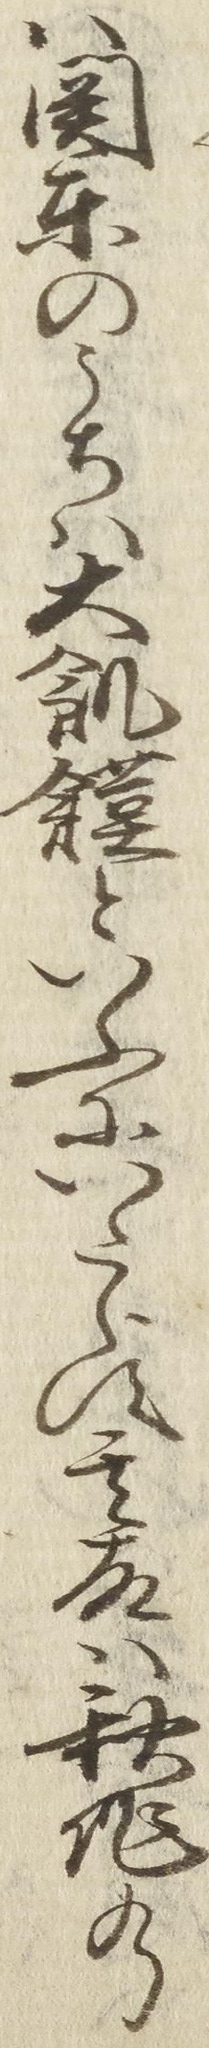は関東のうちは大飢饉といふにいたらす其故は秋作の
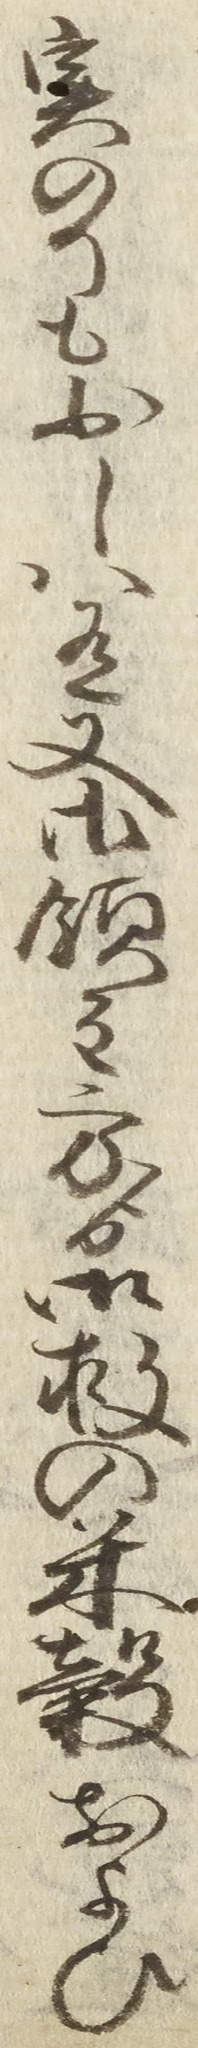実のりも少しは有又御領主方ゟ御救の米穀およひ
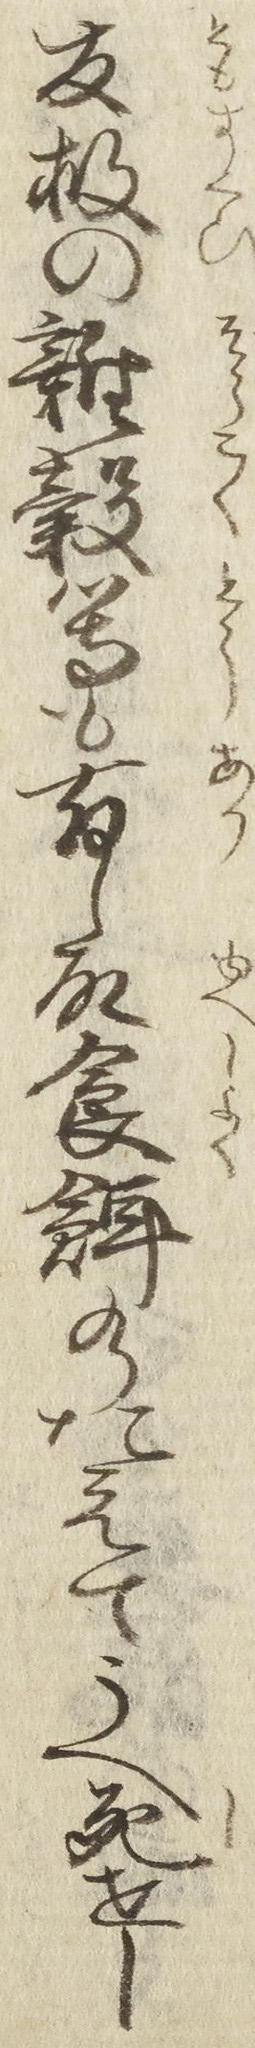友救の雑穀等も有し故食餌のたえてうへ死せし

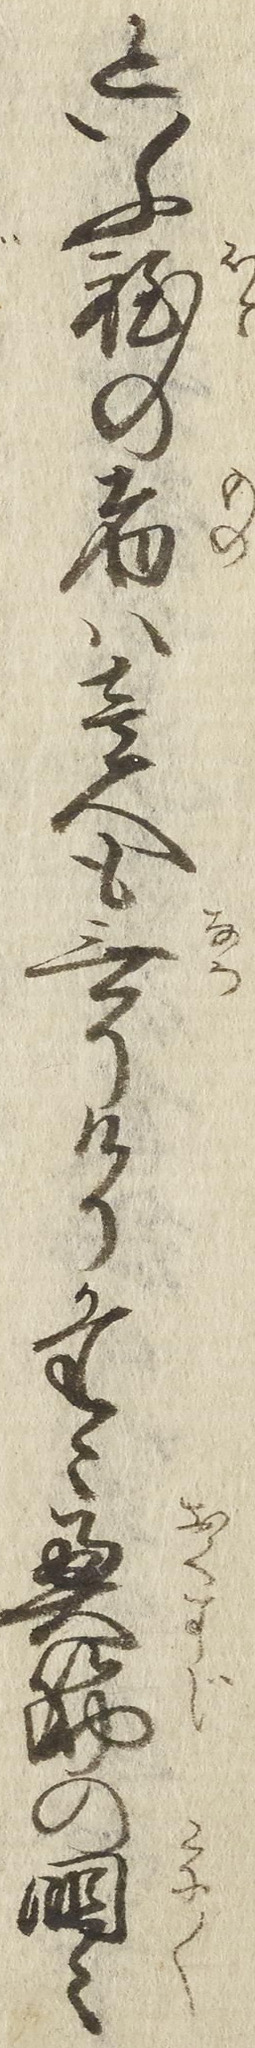といふ程の者は壱人も無りけりた〻奥筋の国〻
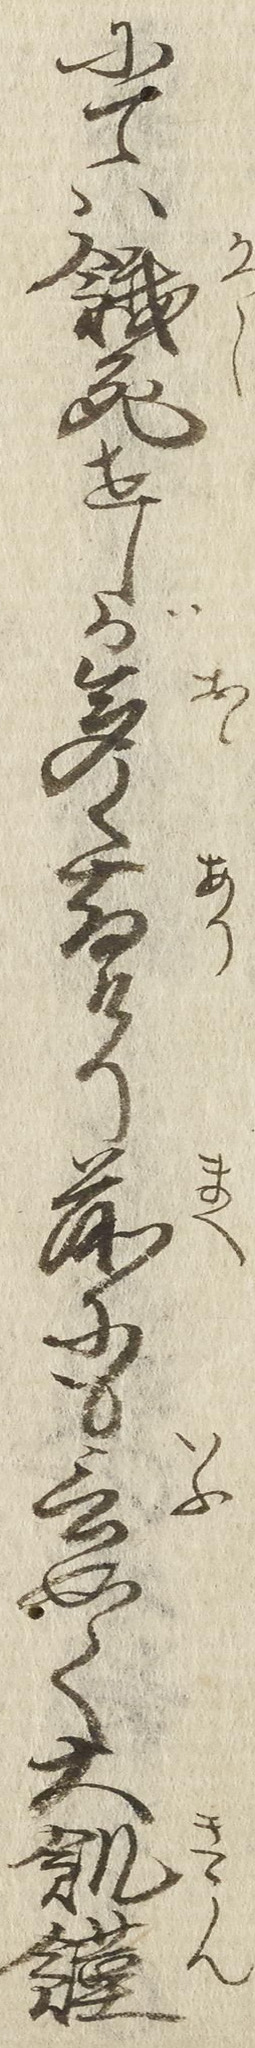にては餓死せしが多く有けり前にも言如く大飢饉
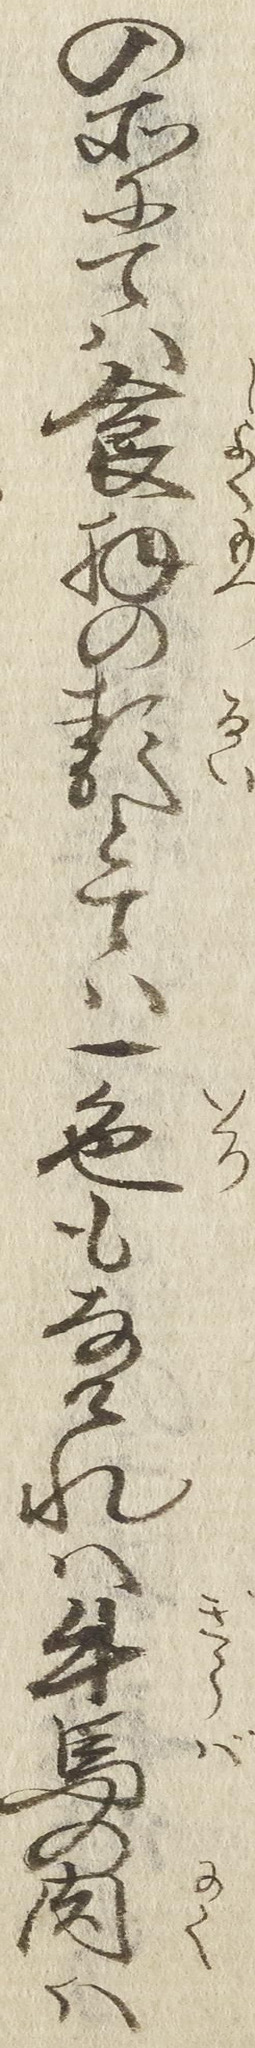の所にては食物の類とては一色もなけれは牛馬の肉は
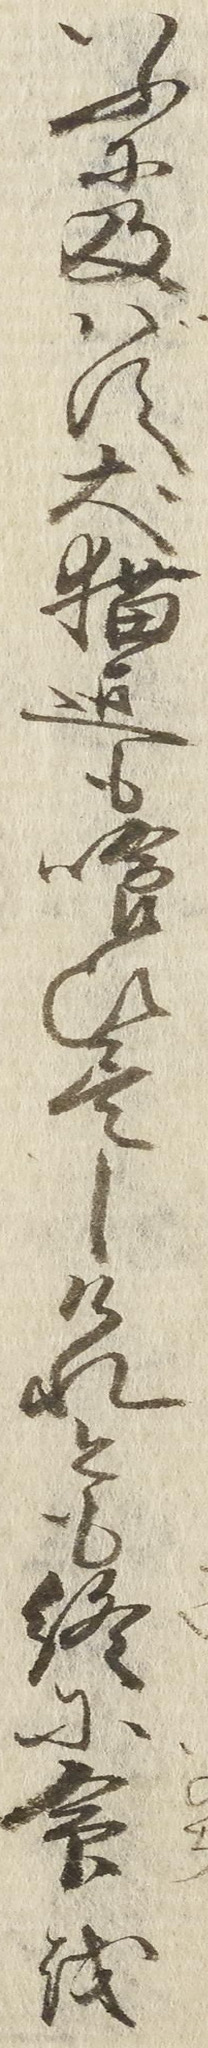いふに及ばす犬猫迄も喰ひ尽しけれとも終に命を
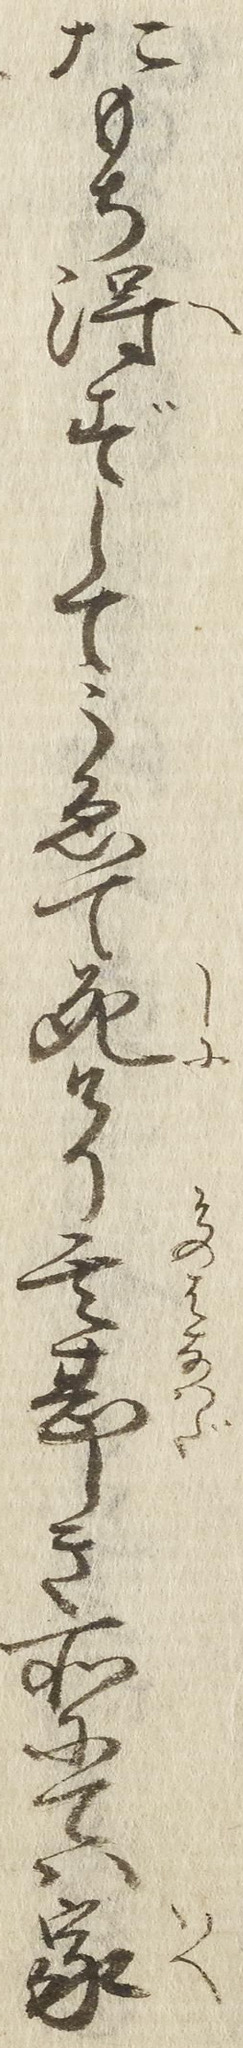たもち得ずしてうゑて死けり其甚しき所にては家
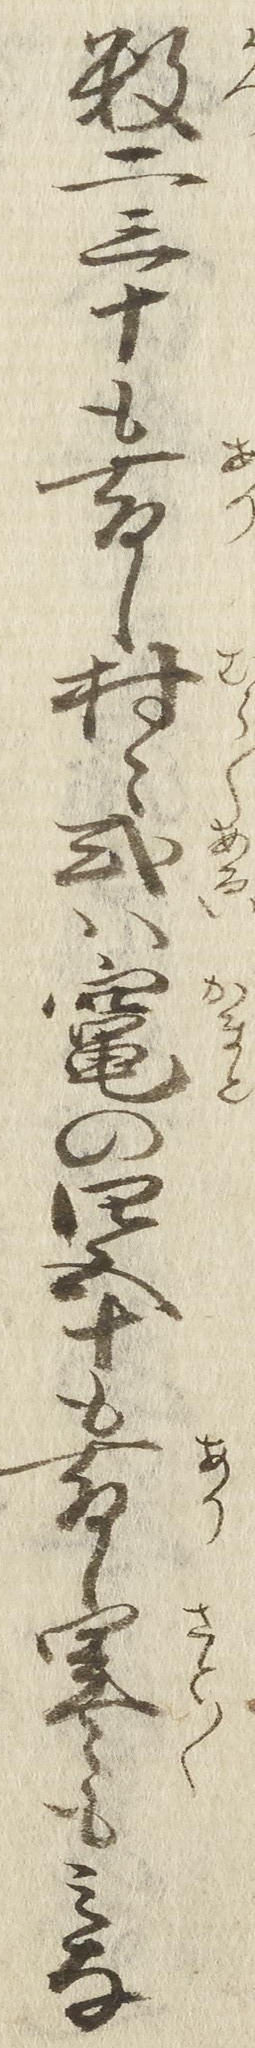数二三十も有し村〻或は竃の四五十も有し里〻もみな
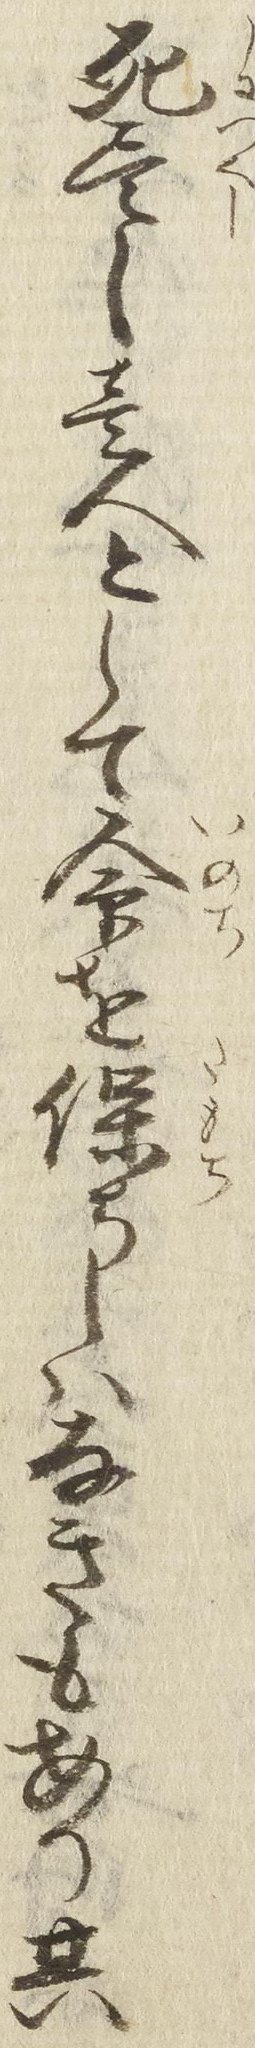死尽し壱人として命を保ちしはなきもあり其
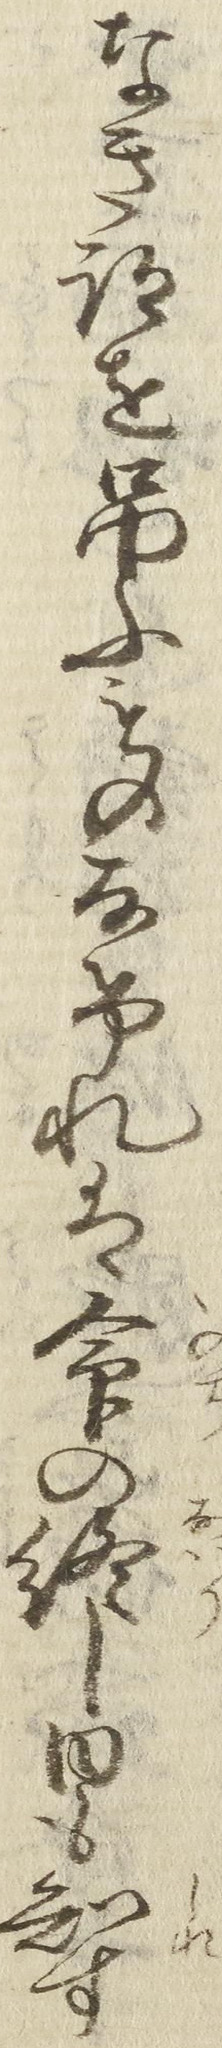なき跡を弔ふものなけれは命の終し日も知す
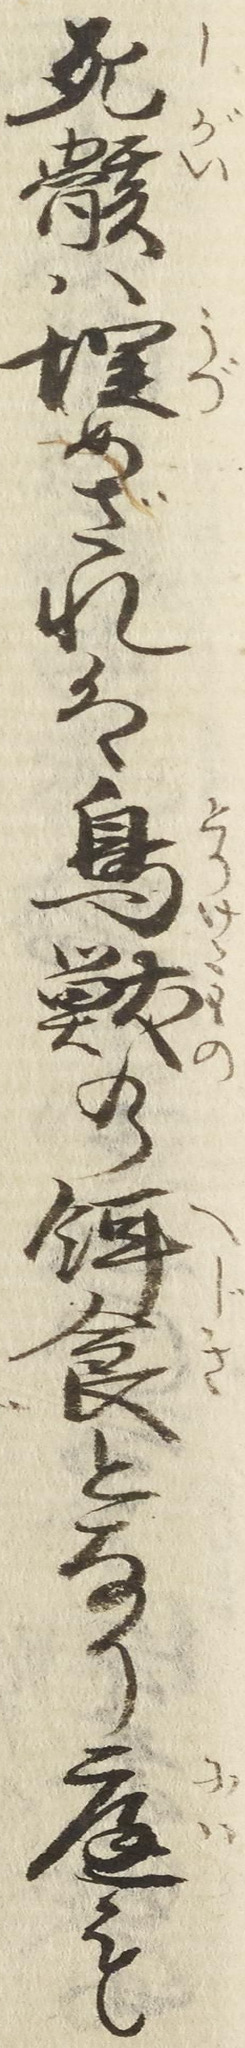死骸は埋めざれは鳥獣の餌食となり庭も
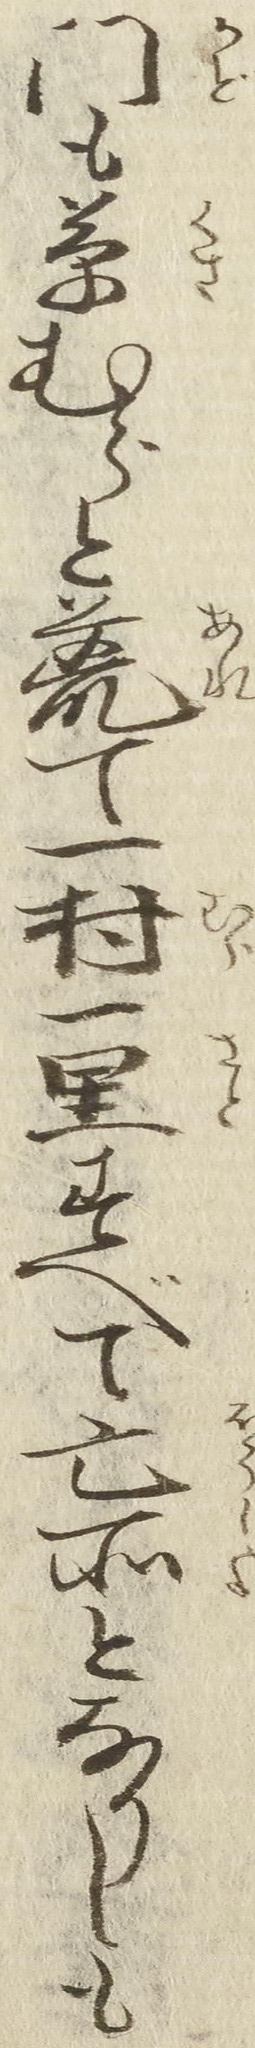門も草むらと荒て一村一里すべて亡所となりしも
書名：天明奇畧　全
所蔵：東京大学地震研究所図書室 Earthquake Research Institute Library, The University of Tokyo, JAPAN
